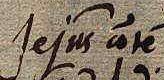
Jejūs cō tē
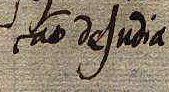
ção de Judia
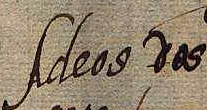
A deos dos
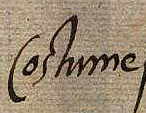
Costume
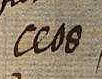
ceos
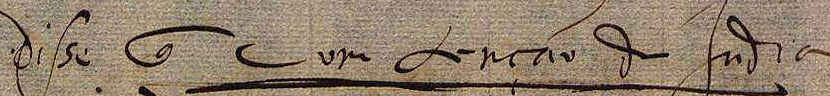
disse q̄ com tenção de Judia
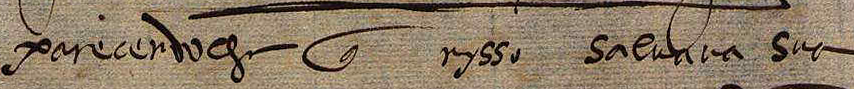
parecendolhe q̅ nysso saluaua sua
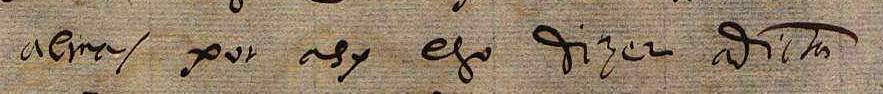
alma / por asy lho dizer a di̅cta
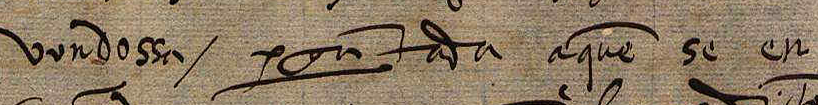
vondossa / ꝑgūtada a quē se en
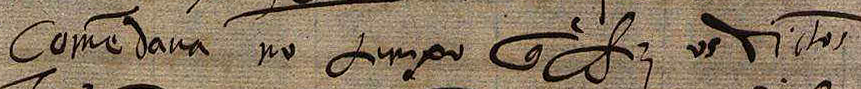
Comēdaua no tempo q̄ fez os dictos
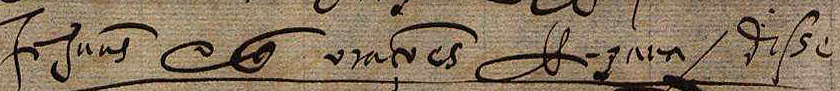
JeJuūs e q̄ orações Rezaua / disse
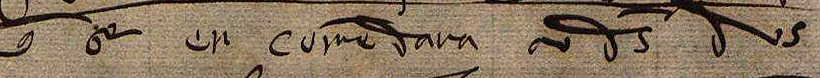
q̄ se encomēdaua ao ds̄ dos
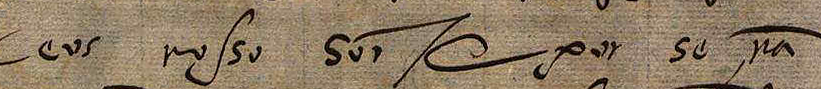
ceos nosso sōr / e por se nā
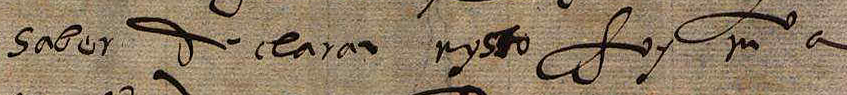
saber declarar nysto foy mto a
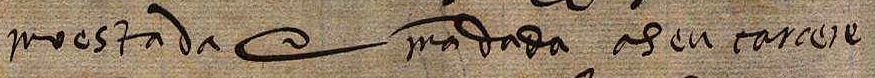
moestada e m̄adada a seu carcere
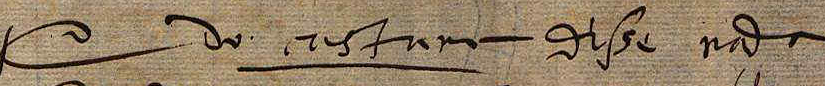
E do custume disse nada
